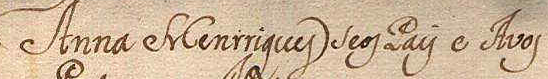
Anna Henrriques seos Pais e Avos
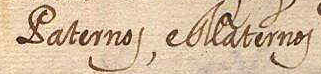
Paternos, e Maternos
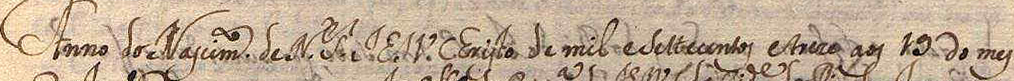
Anno do Nascim.to de N. S.r IESV. Christo de mil e Settecentos e treze aos 19 do mes
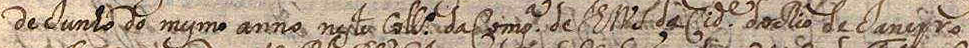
de Iunho do mesmo anno neste Coll.o da Comp.a de IESVs da Cid.e do Rio de Ianeyro
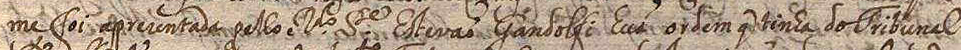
me foi aprezentada pello R.do P.e Estevaõ Gandolfi huā ordem q̄ tinha do Tribunal
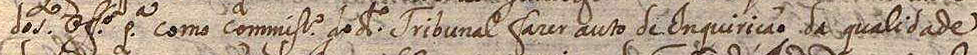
do s.to Off.o p.a como commiss.o do d̄.o Tribunal fazer auto de Inquiriçaõ da qualidade
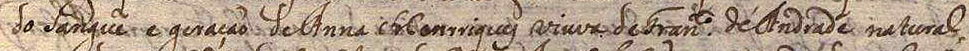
do Sangue e geraçaõ de Anna Henrriques viuva de Fran.co de Andrade natural,
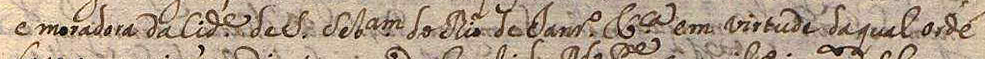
e moradora da Cid.e de S. Seb.am do Rio de Ianr.o &.ca em virtude da qual ordē
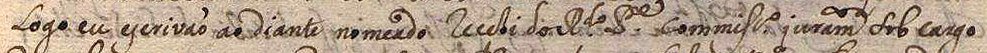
Logo eu escrivaõ ao diante nomeado Recebi do R.do P.e Commiss.o juram.to sob cargo
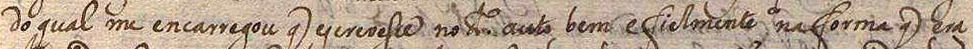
do qual me encarregou q̄ escrevesse no d̄.o auto bem e fielmente na forma q̄ era
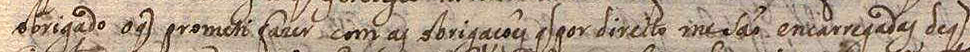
obrigado o q̄ prometi fazer com as obrigaçoẽs q̄ por diretto me saõ encarregadas de q̄
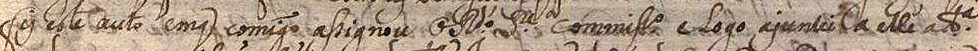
fis este auto em q̄ comigo assignou o R.do P.e Commiss.o e Logo ajuntei a elle a d̄.a
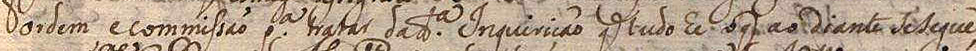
ordem, e commissaõ p.a tratar da d̄.a Inquirição q̄ tudo he o q̄ ao diante se segue
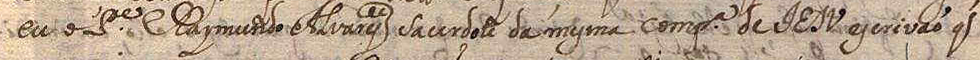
eu o P.e Raymundo Alvares Sacerdote da mesma comp.a de IESV escrivaõ q̄
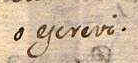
o escrevi.
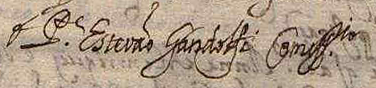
O P.e Estevão Gandolfi Comss.rio
